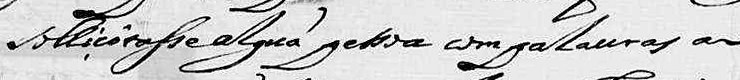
sollicitasse alguā pessoa com palauras a
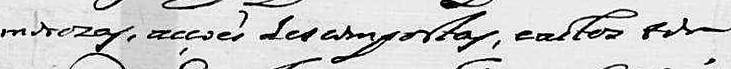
morozas, acçoẽs descompostas, e actos tor
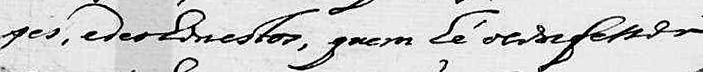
pes, e deshonestos, quem hé o confessor
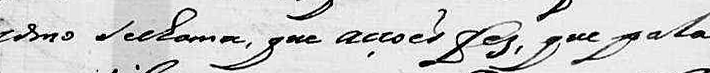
como se chama, que acçoẽs fez, que pala
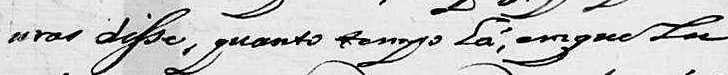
uras disse, quanto tempo há, em que Lu
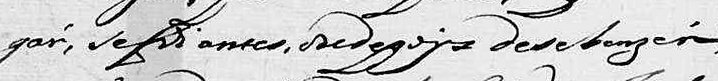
gar, se foi antes, ou depoys de se benzer,
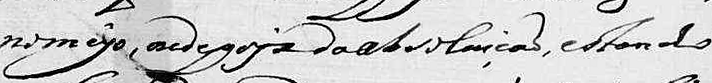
no meyo, ou depoys da absoluiçaõ, estando
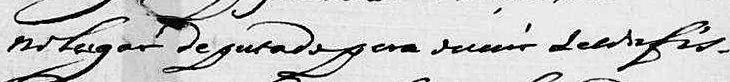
no lugar deputado pera ouuir de confis
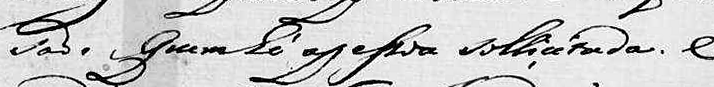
saõ. Quem hé a pessoa sollicitada. e
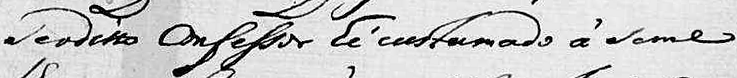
se o ditto Confessor hé custumado á seme
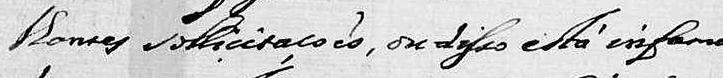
lhantes sollicitaçoẽs, ou disso está infama
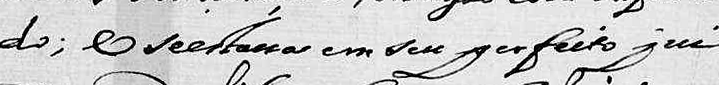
do; e se estaua em seu perfeito jui
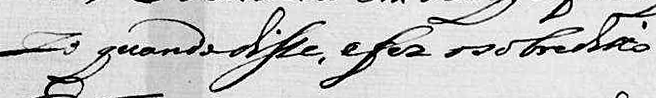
Zo quando disse, e fez o sobreditto?
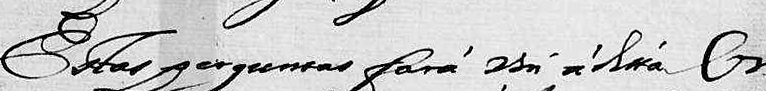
Estas perguntas fará v m à ditta Ur
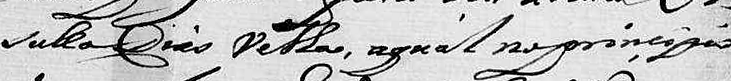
sulla Dias Velha, a qual no principio
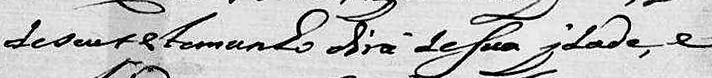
de seu testemunho dirá de sua jdade, e
